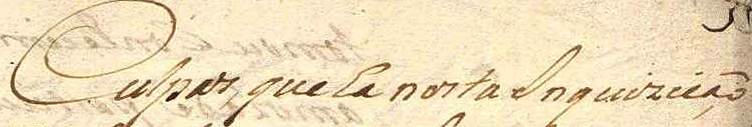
Culpas, que ha nesta Inquiziçaõ
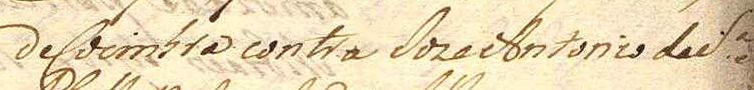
de Coimbra contra Ioze Antonio da S.a e
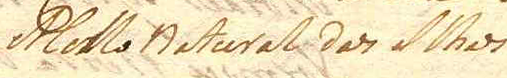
Mello natural das Ilhas
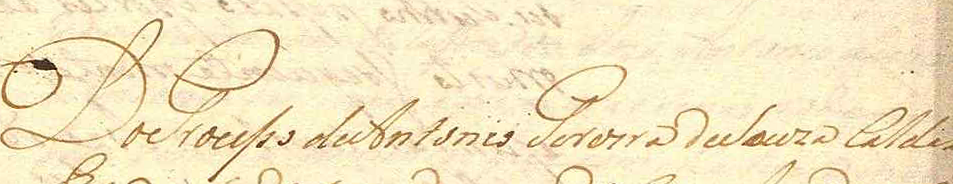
Do Processo de Antonio Pereira de Souza Caldas
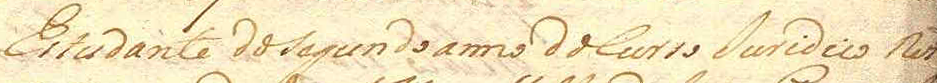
Estudante do segundo anno do Curso Iuridico Nes
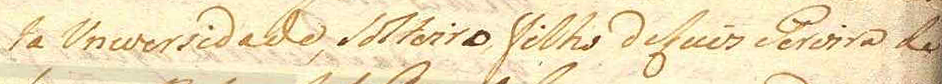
ta Uneversidade, solteiro filho de Luis Pereira de
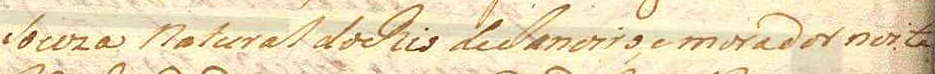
Souza Natural do Rio de Ianeiro, e morador nesta
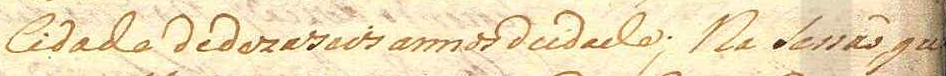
Cidade de dezaseis annos de idade; Na sessaõ qu
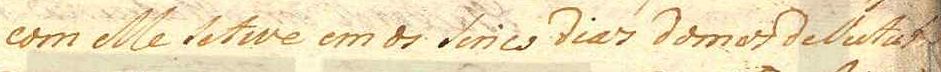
com elle se teve em os sinco dias do mes de Outubro
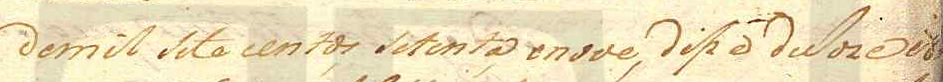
de mil setecentos setenta e nove, disse de Ioze A
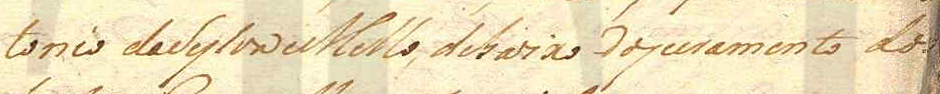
tonio da Sylva e Mello, debaixo do juramento dos
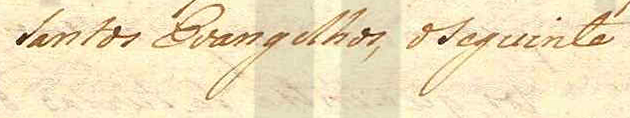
santos Evangelhos, o seguinte
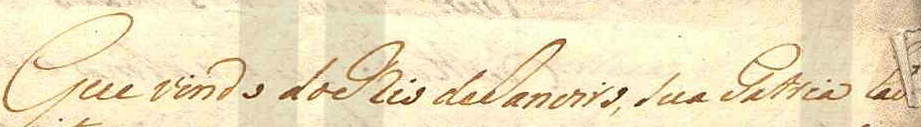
Que vindo do Rio de Ianeiro, sua Patria hau
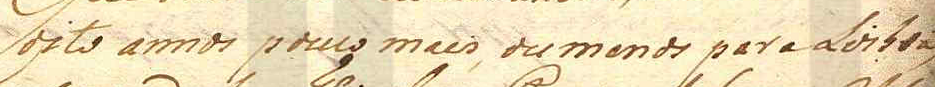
oito annos pouco mais, ou menos para Lisboa
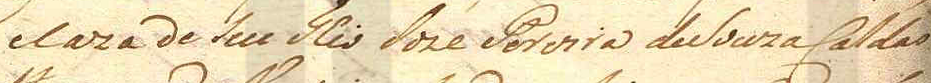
e Caza de seu Tio Ioze Pereira de Souza Caldas
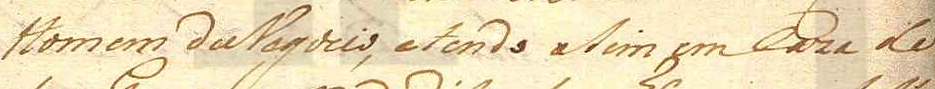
Homem de Negocio, e tendo aSim em Caza de
